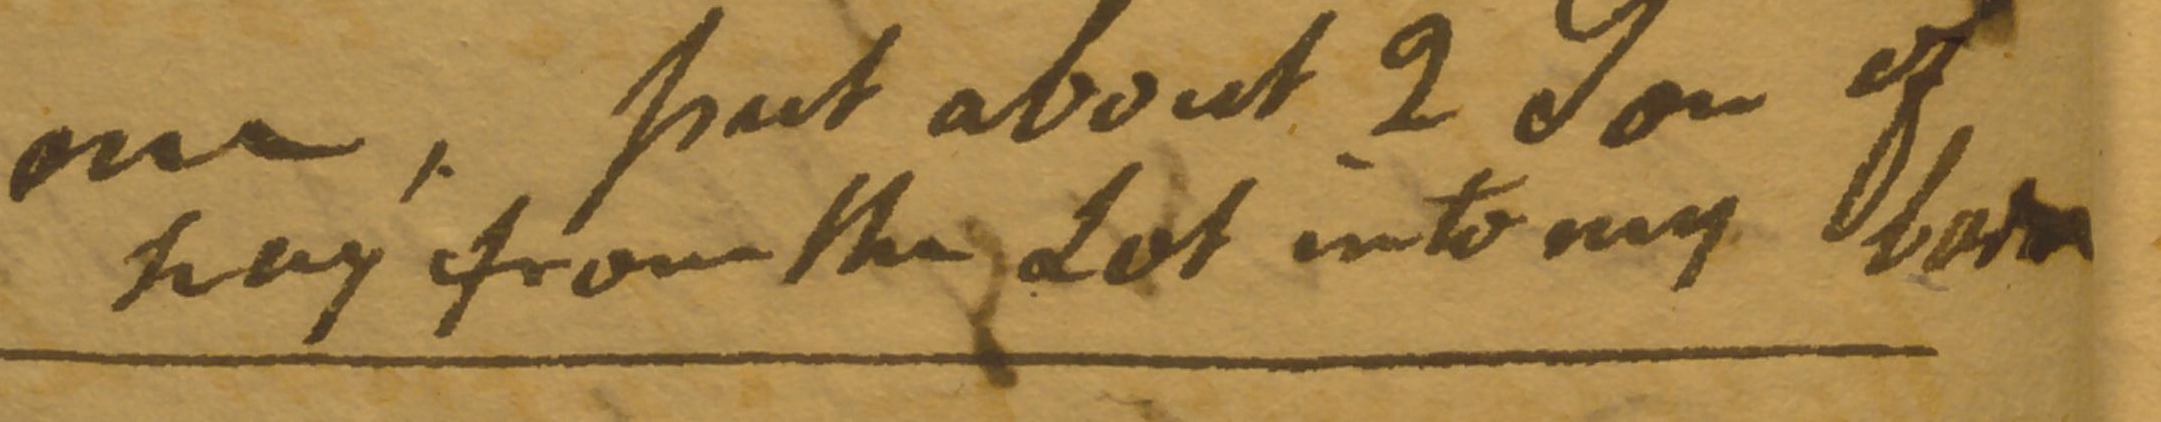hay from the Lot into my barn
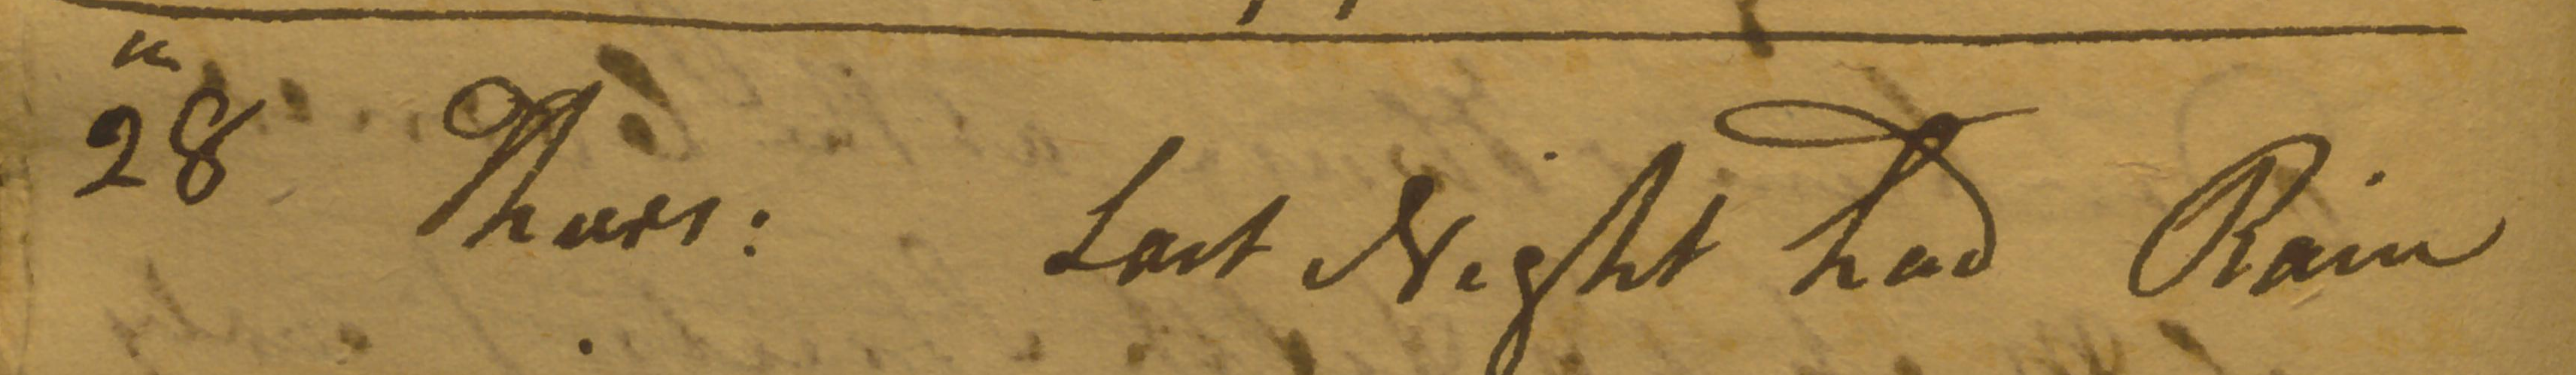28 Thurs. Last Night had Rain
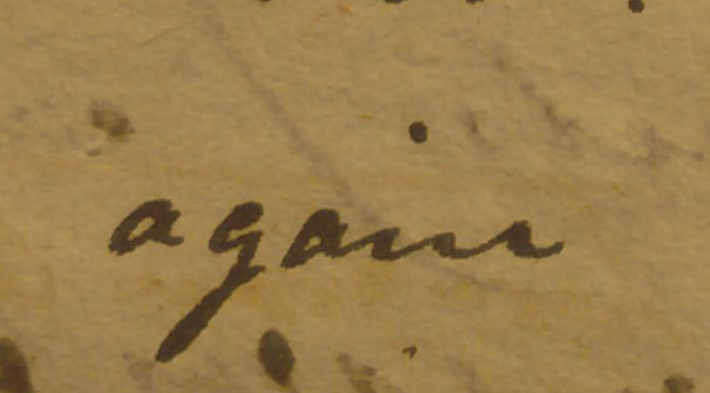again
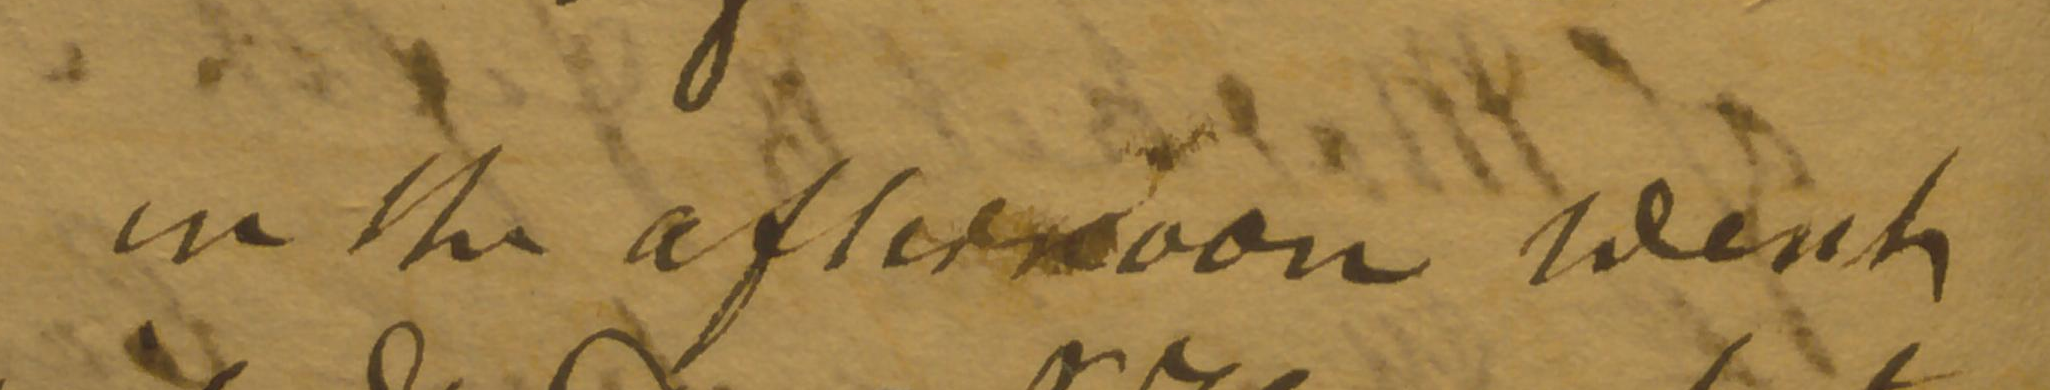in the afternoon went
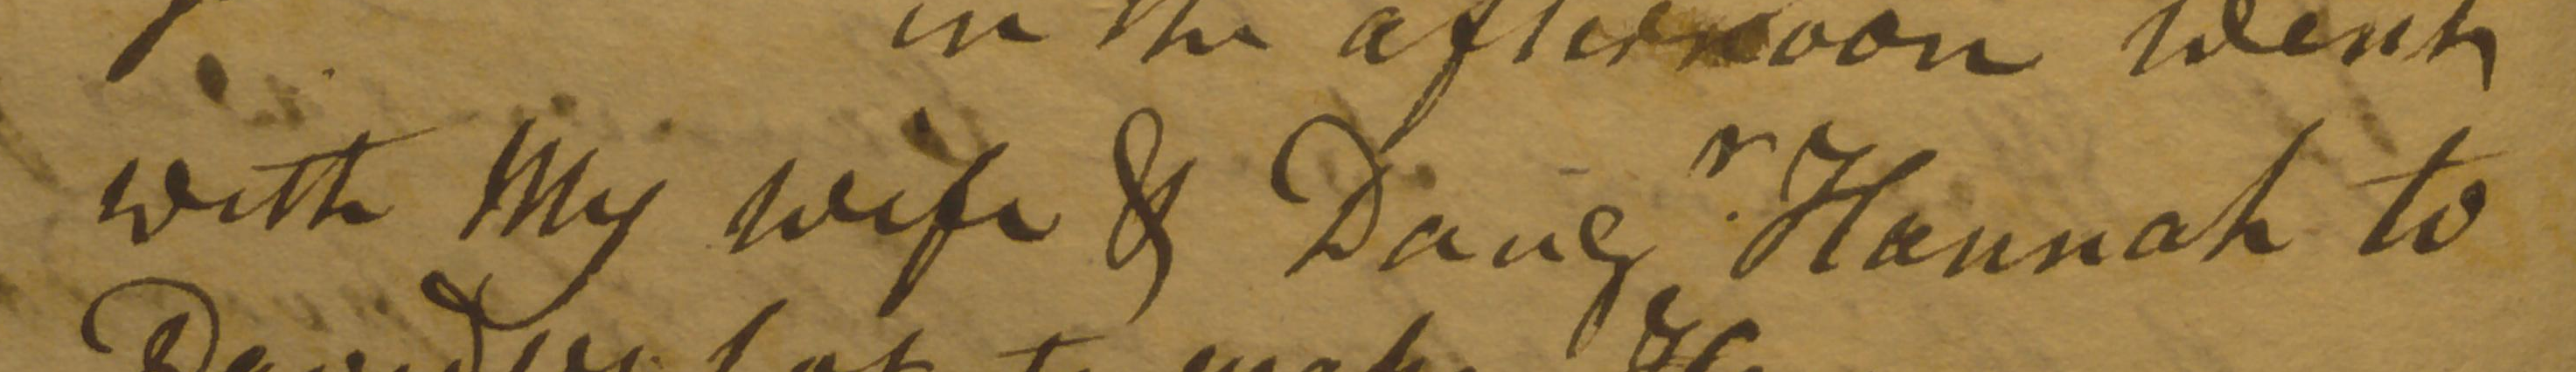with My wife & Daug^r. Hannah to
